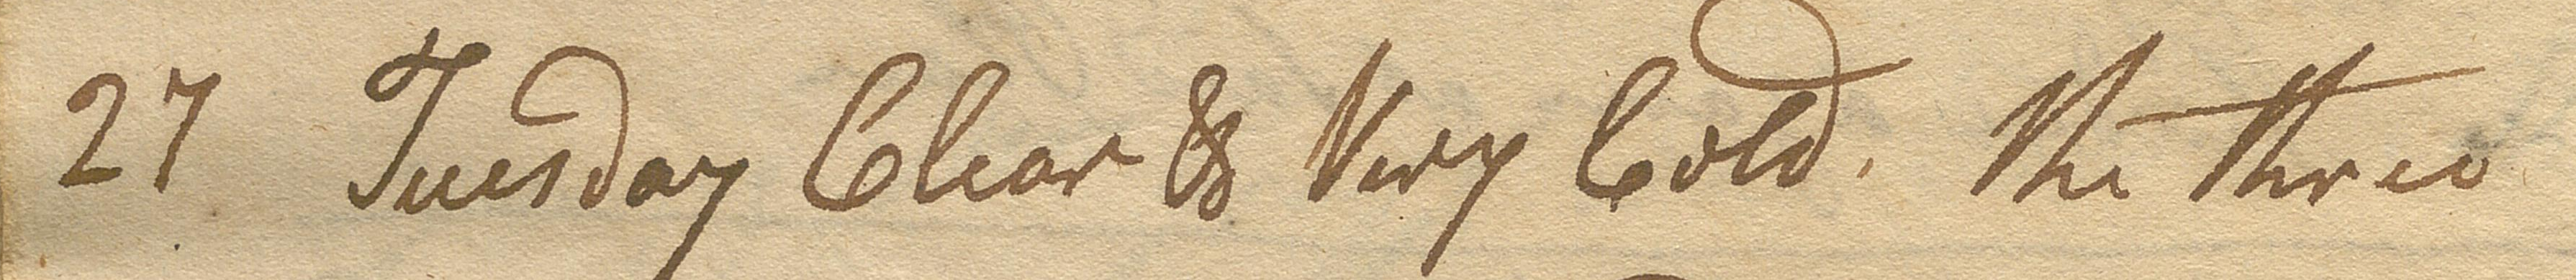27 Tuesday Clear & Very Cold. the three
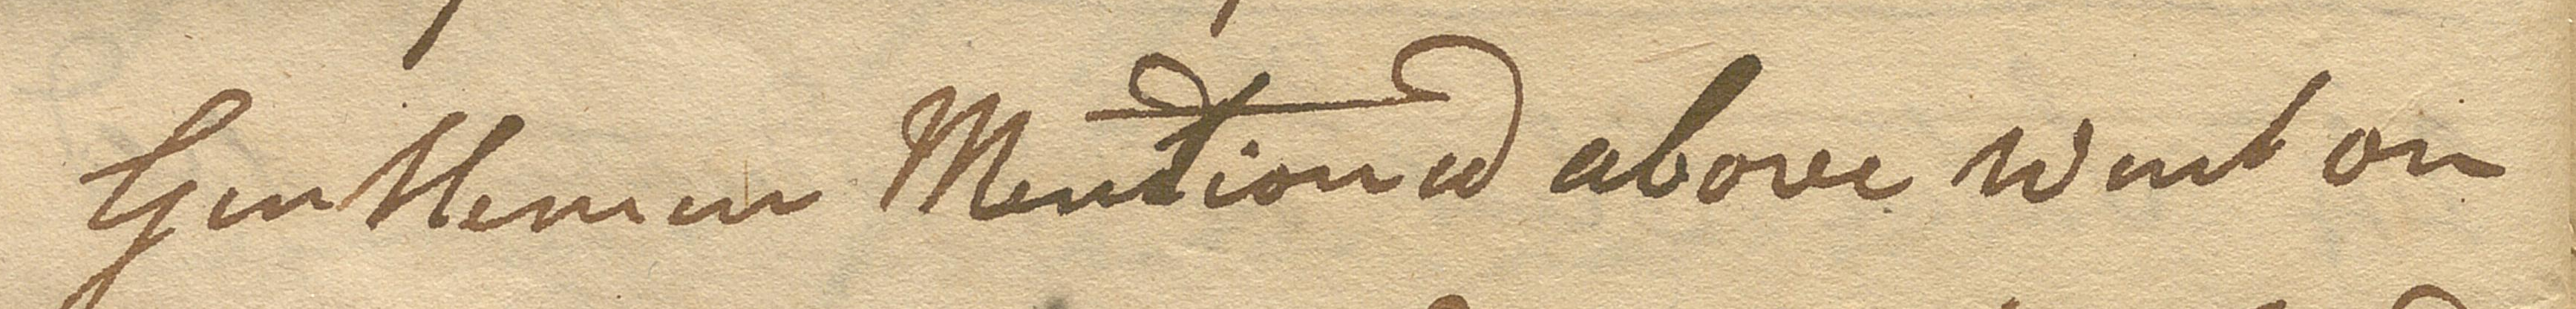Gentlemen Mentioned above went on
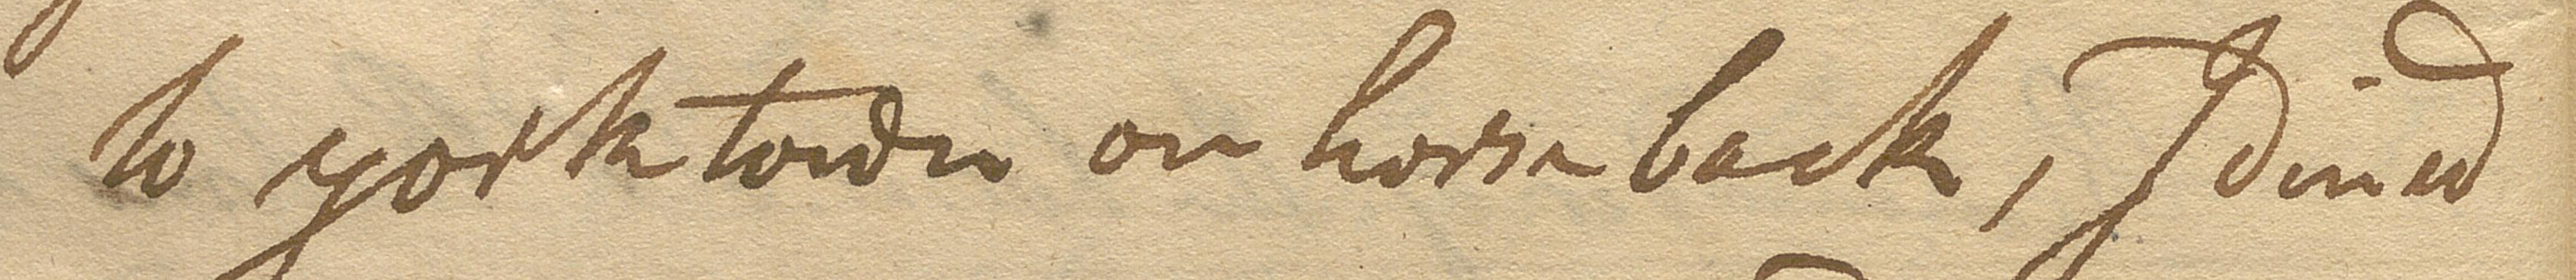to york town on horse back, I dined
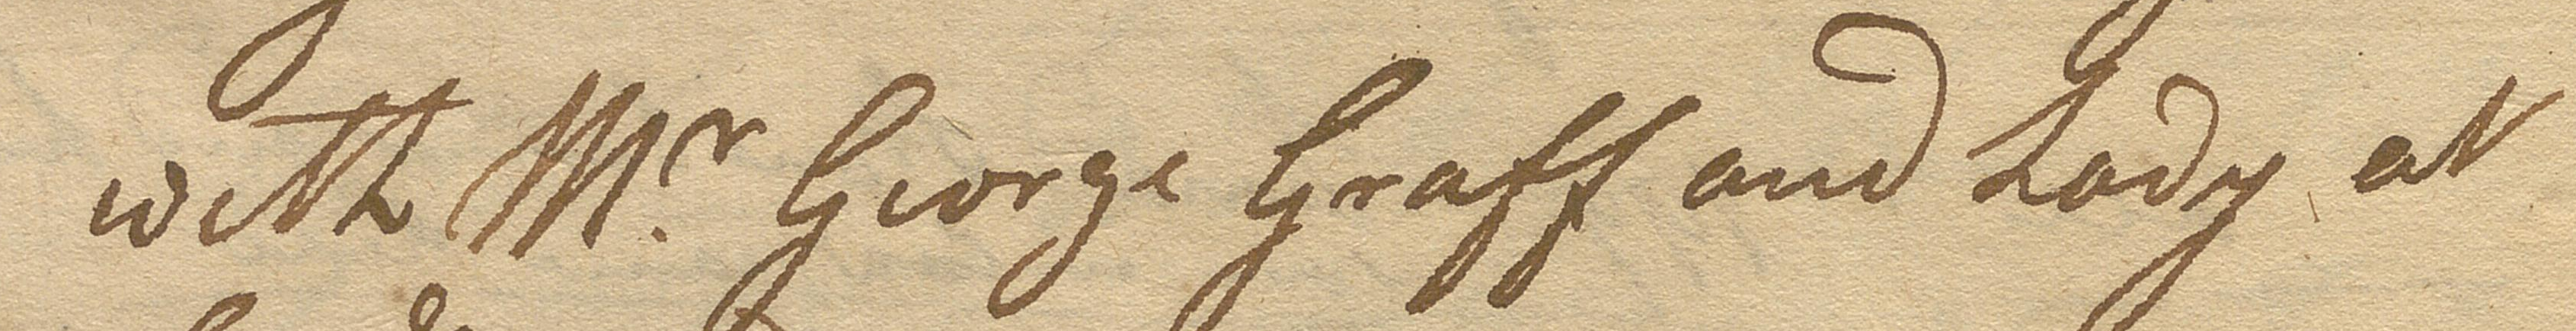with M^r. George Graff and Lady at
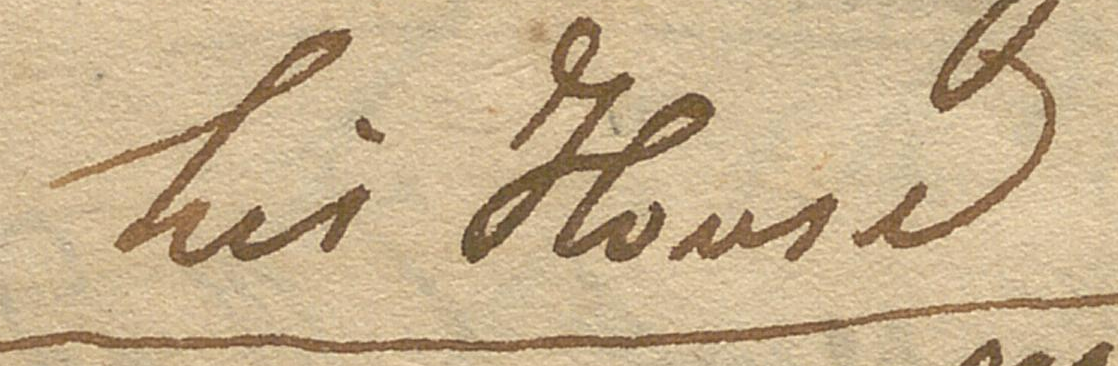his House
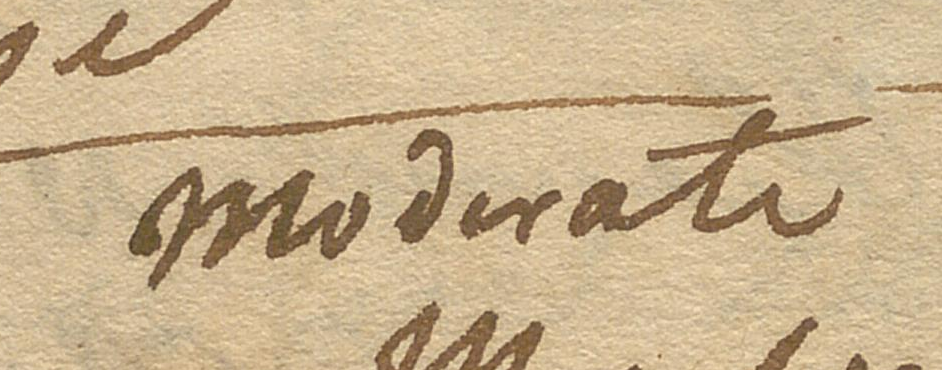moderate
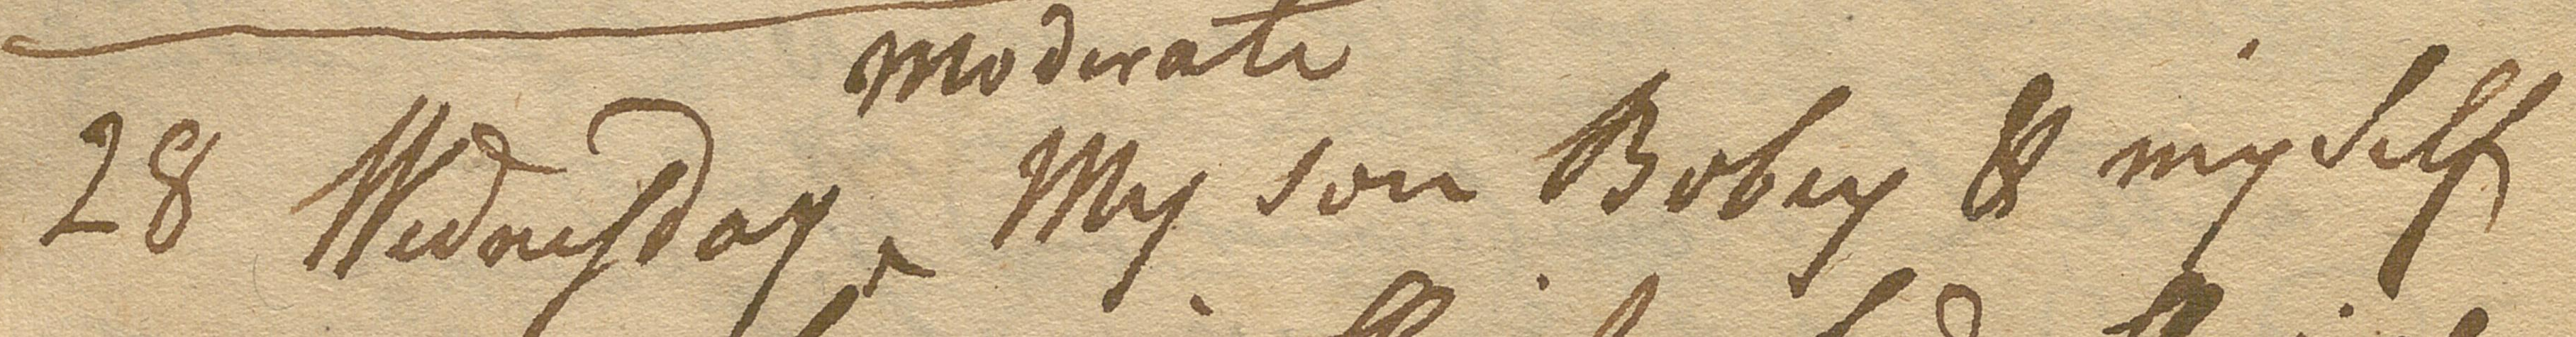28 Wednesday ^ My son Bobey & my Self
